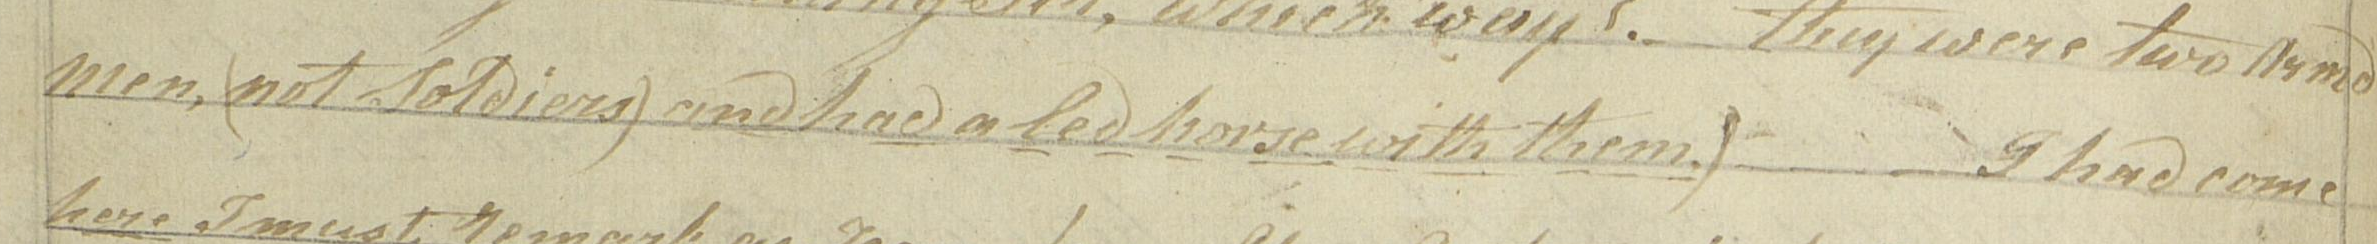men, (not soldiers) and had a led horse with them.) I had come
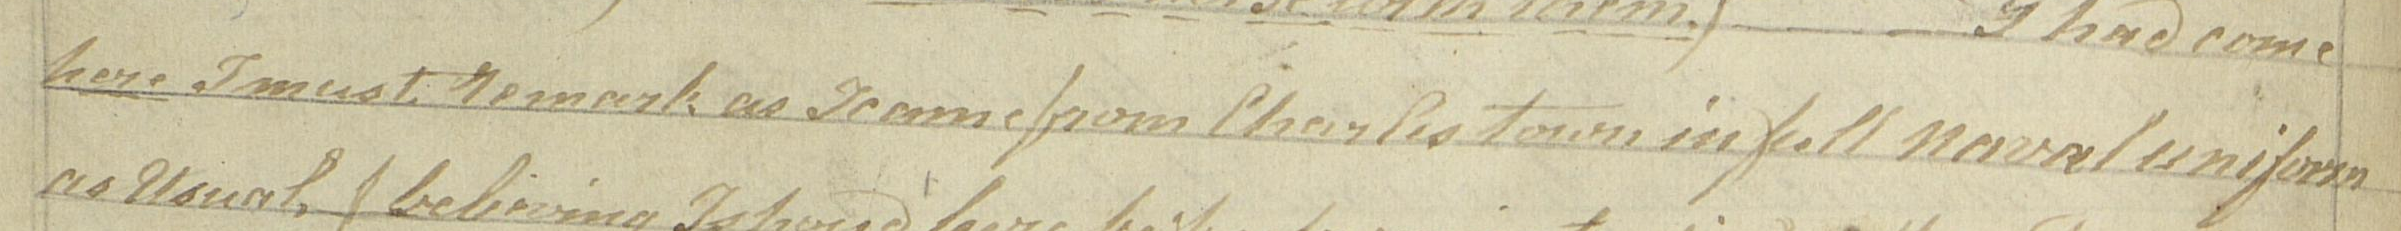here I must remark as I came from Charles town in full naval uniform
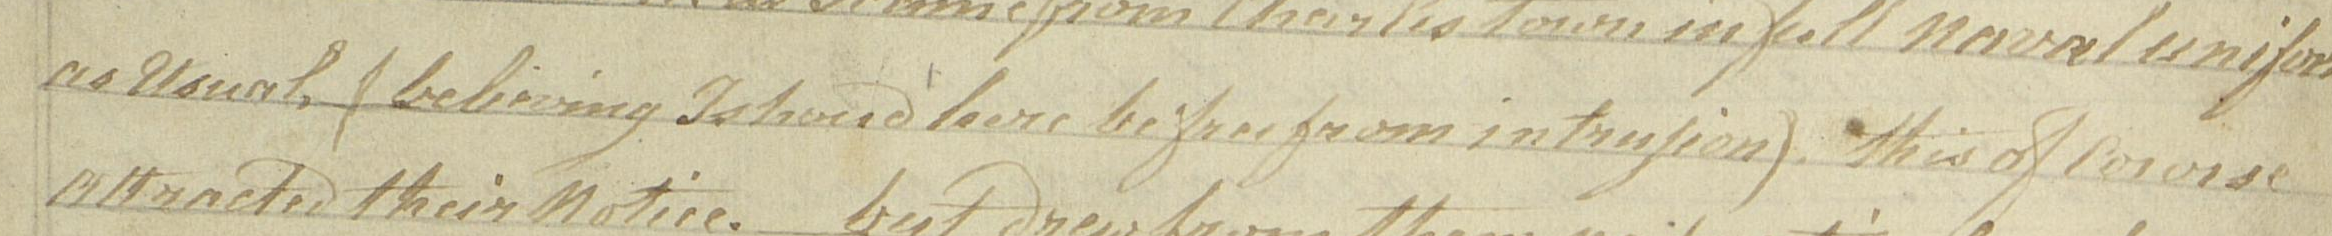as Usual (believing I shoud here be free from intrusion) This of Course
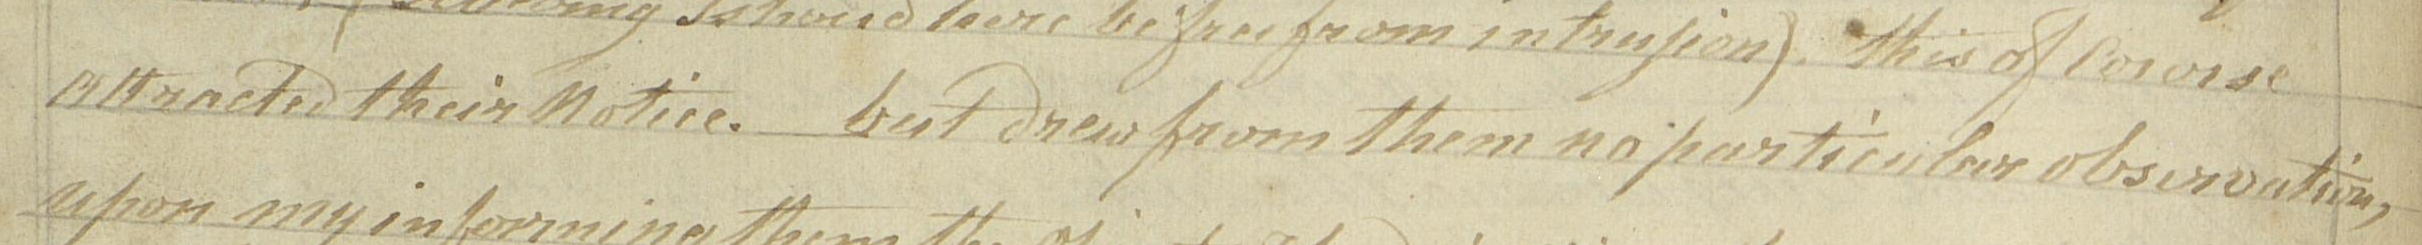attracted their Notice. but drew from them no particular observation
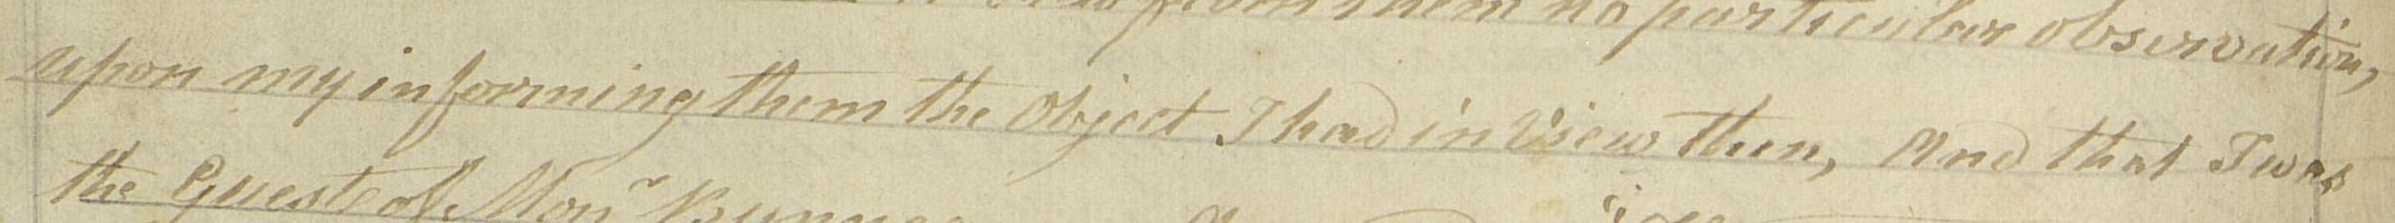upon my informing them the Object I had in view then, And that I was
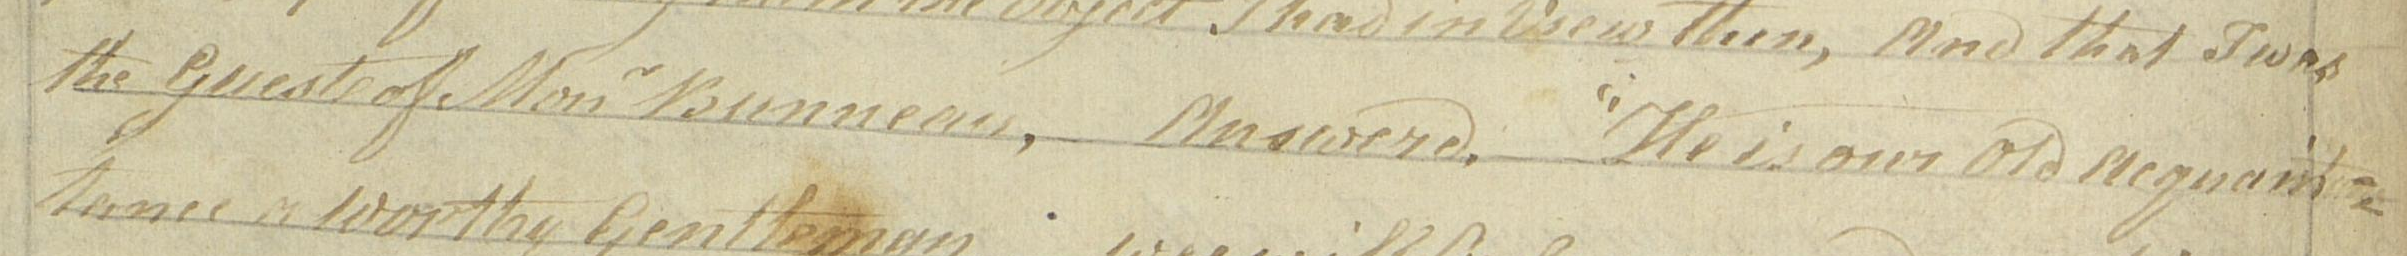the Guest of Mon^r Bunneau, Answerd. "He is our Old Acquaint-
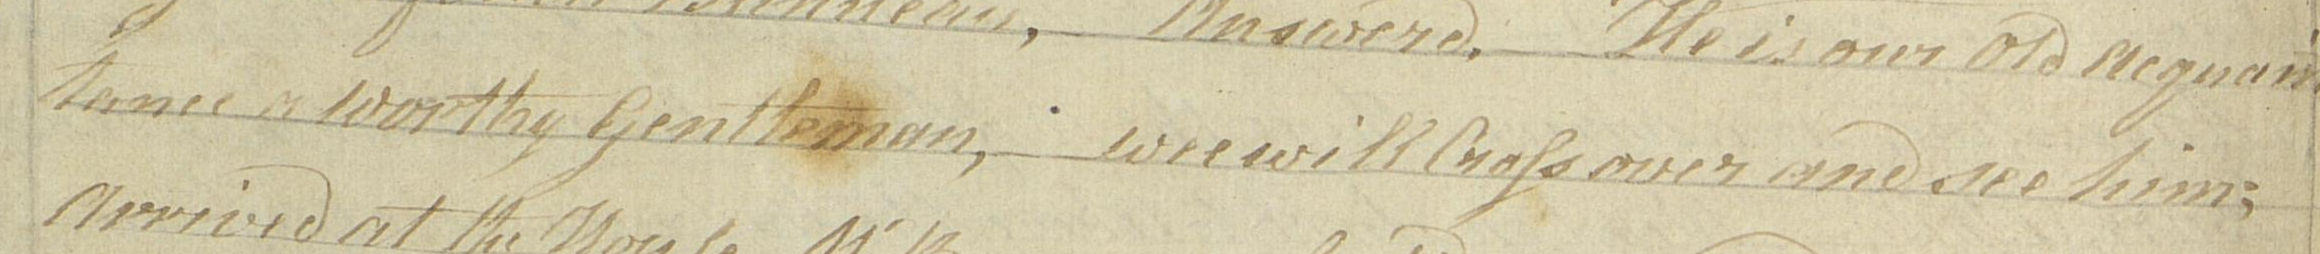-tance a Worthy Gentleman, we will Cross over and see him;
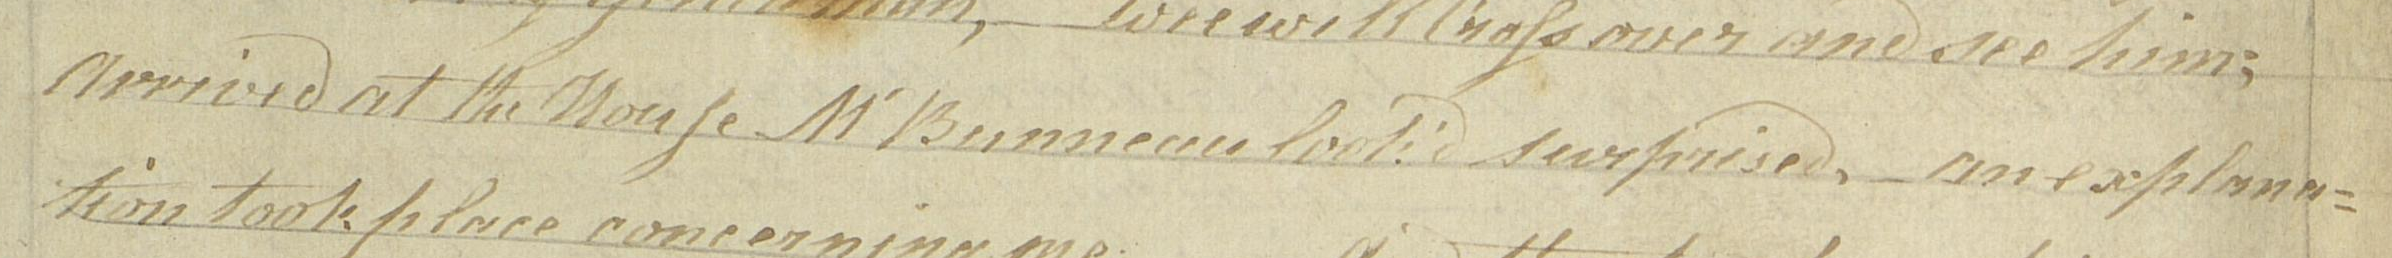arrived at the House M^r. Bunneau look'd surprised, an explana-
